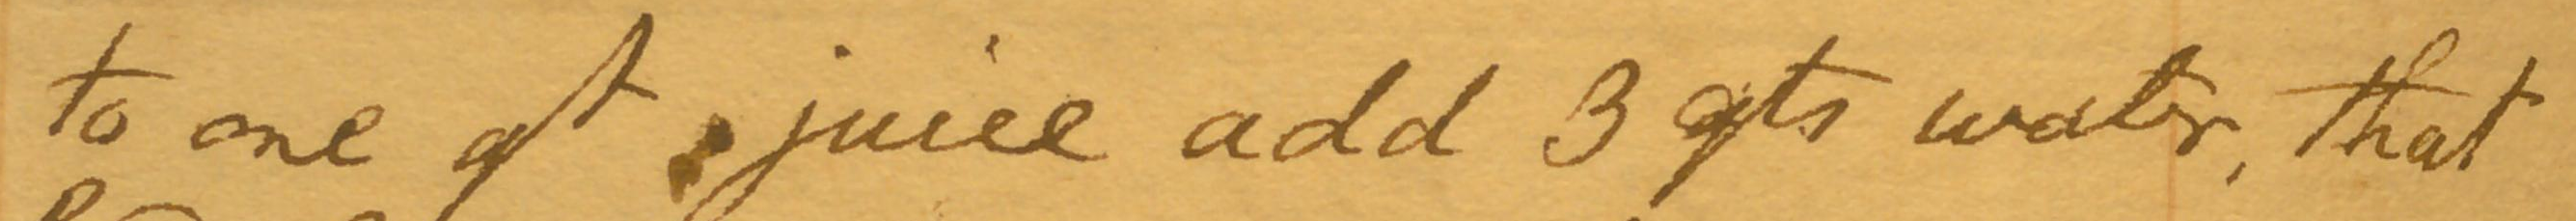to one q^t juice add 3 qts water that
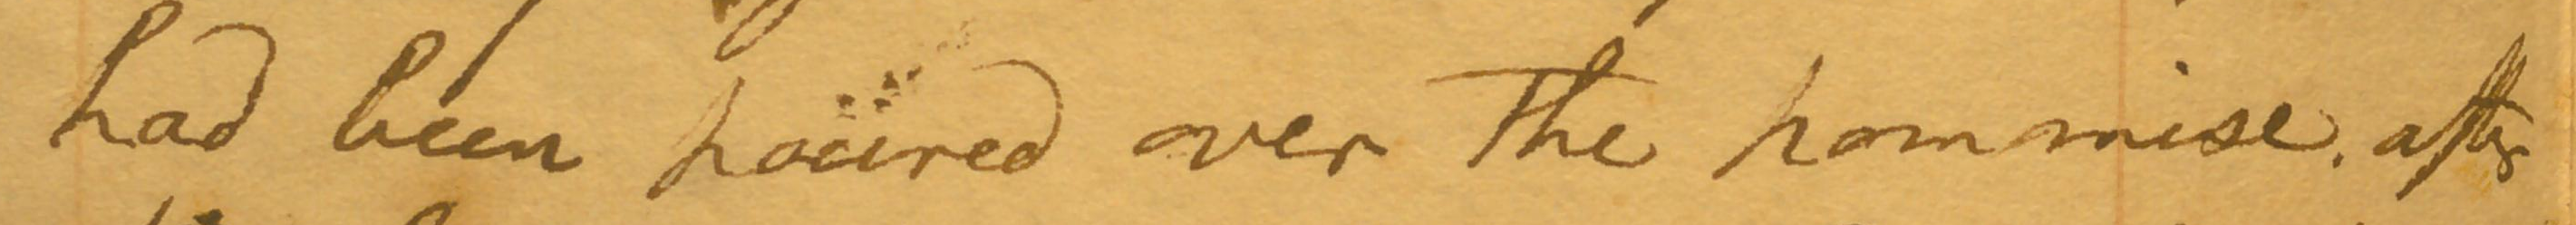had been poured over the hornmise after
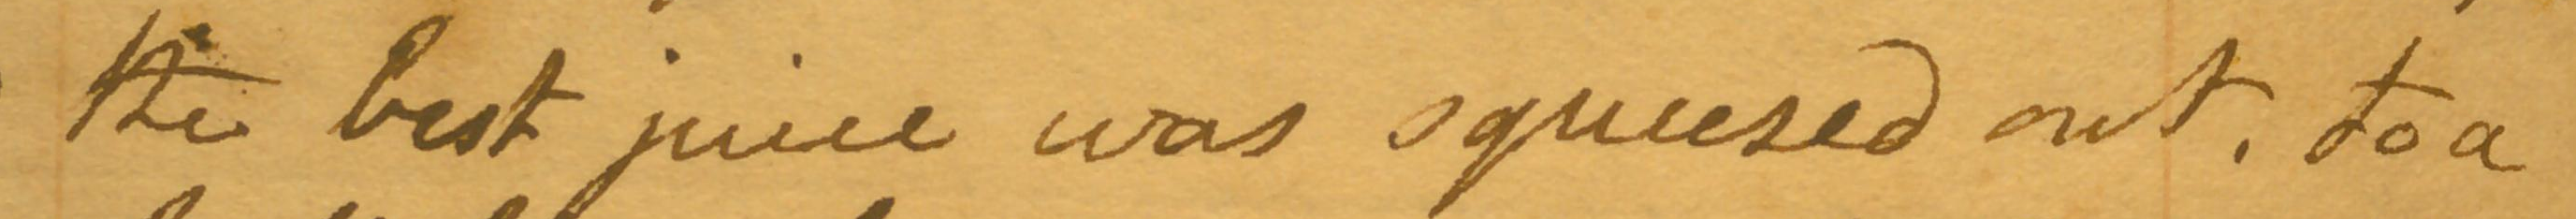the best juice was squeesed out, to a
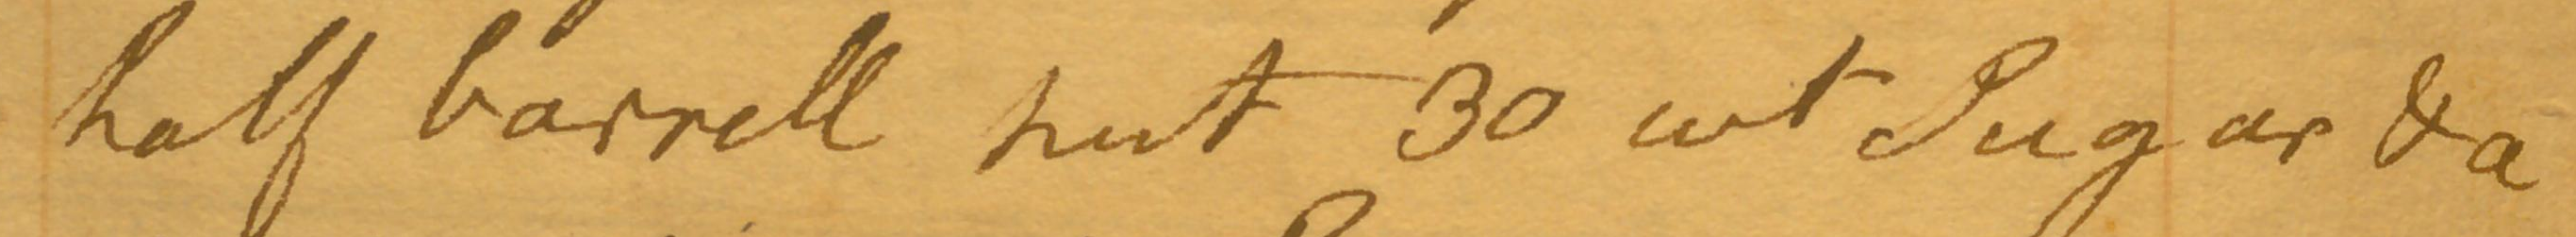half barrell put 30 w^t Sugar & a
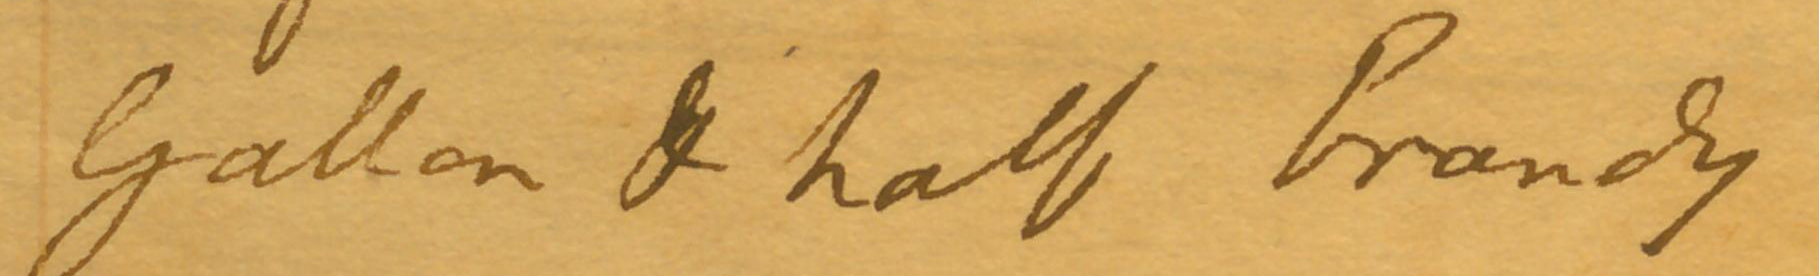Gallon & half brandy
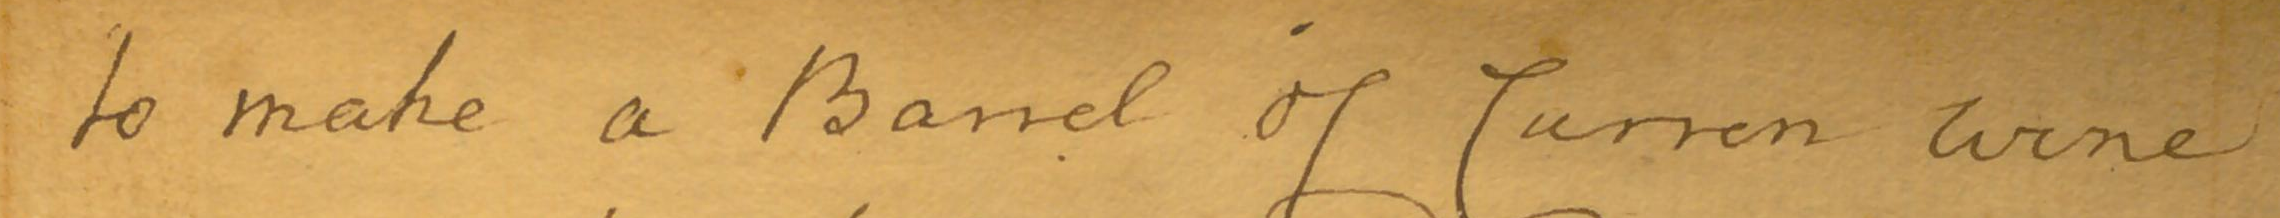to make a Barrel of Curren wine
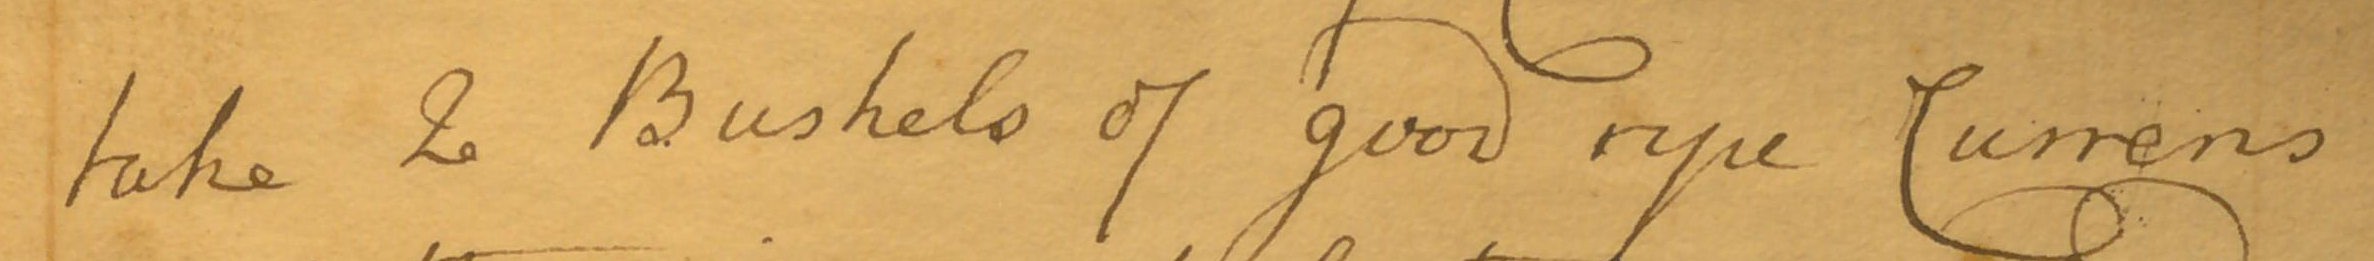take 2 Bushels of good ripe Currens
